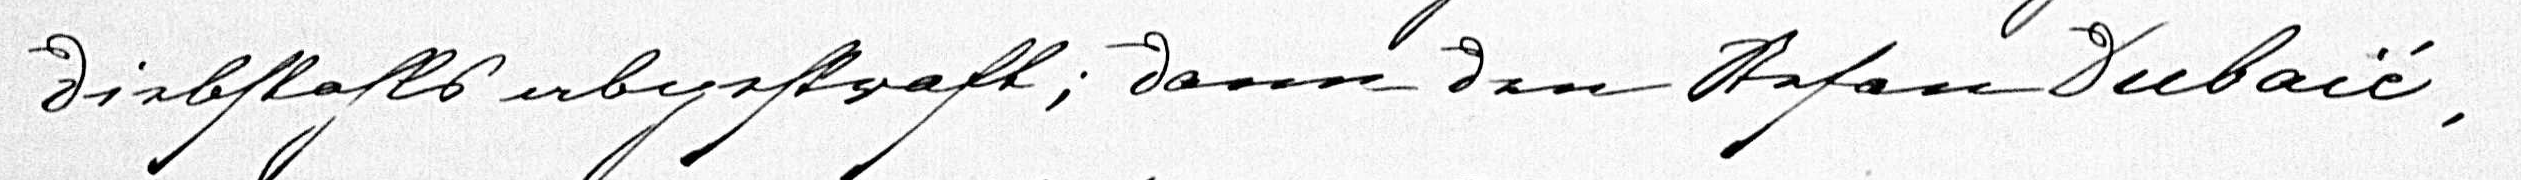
Diebstahls abgestraft; dann den Stefan Dubaić,
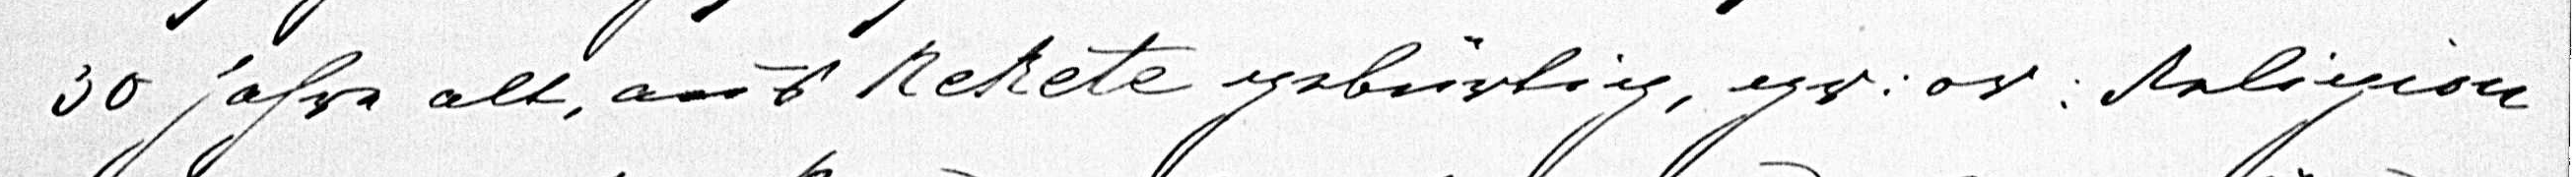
30 Jahre alt, aus Nekete gebürtig, gr. or. Religion
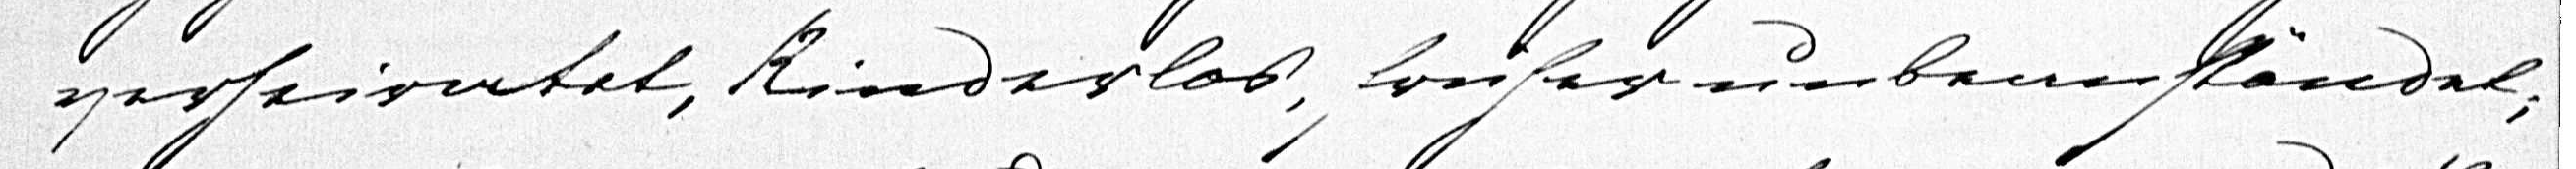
verheiratet, Kinderlos, früher unbeanständet;
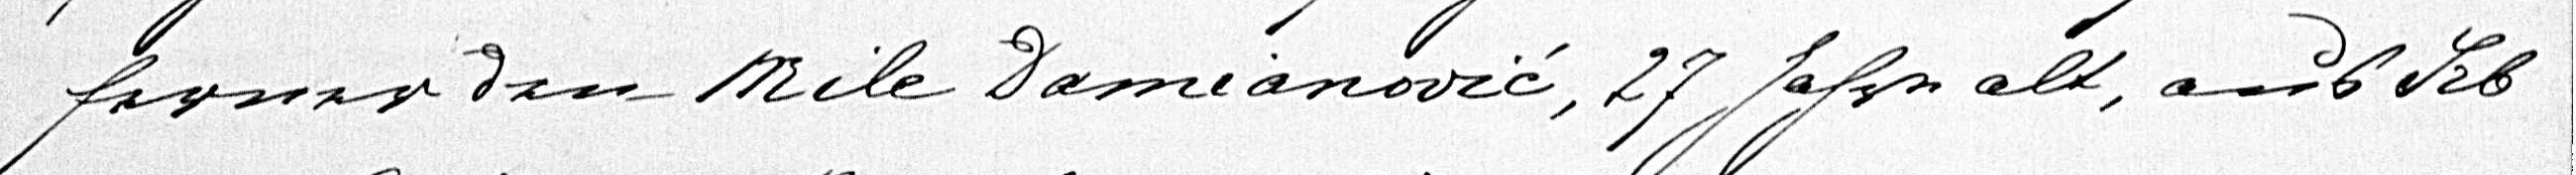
ferner den Mile Damianović, 27 Jahre alt, aus Srb
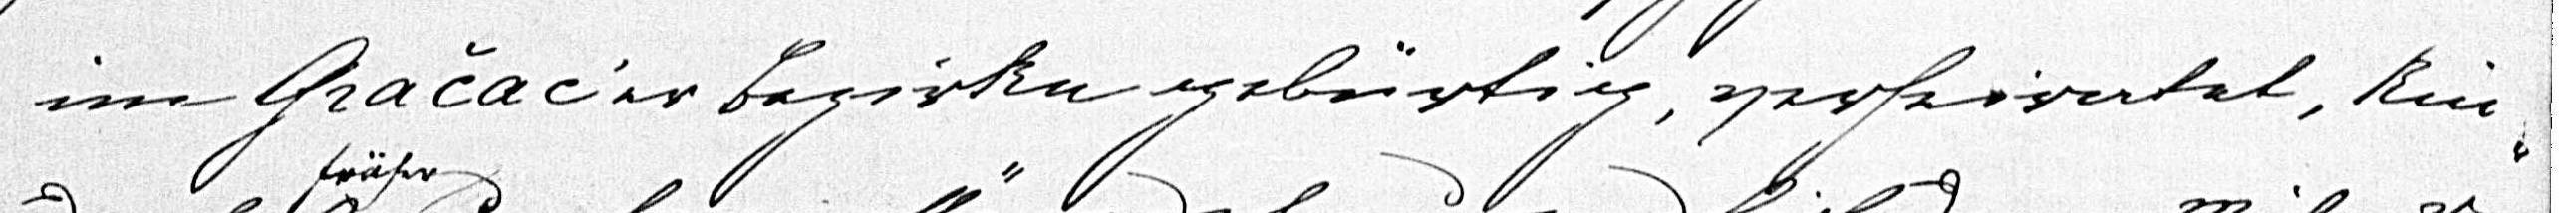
im Gračac’er Bezirke gebürtig, verheiratet, Kin¬
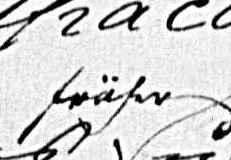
früher
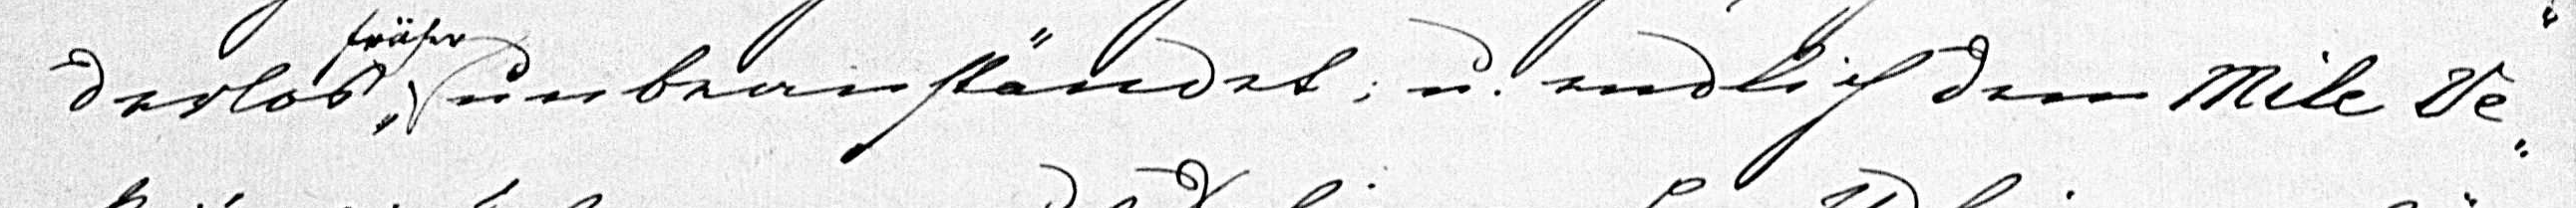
derlos unbeanständet; u. endlich den Mile Ve¬
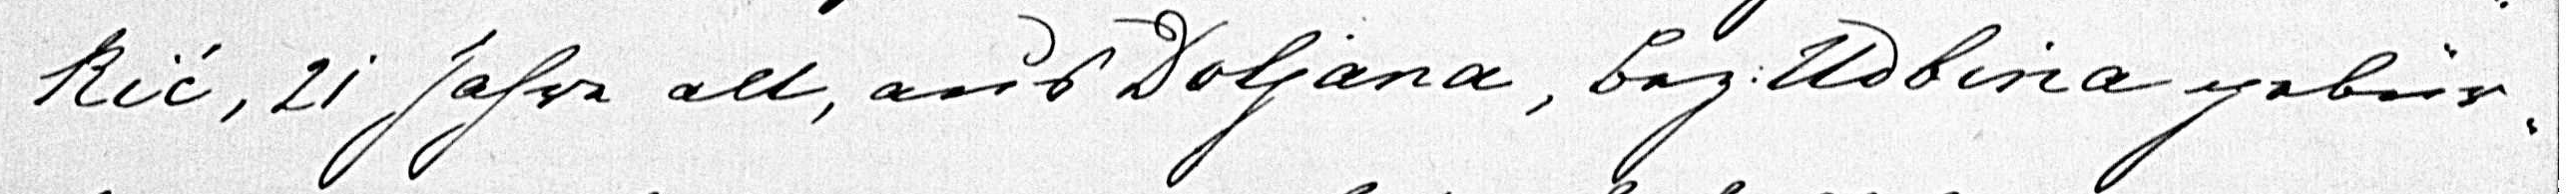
kić, 21 Jahre alt, aus Doljana, Bez. Udbina gebür¬
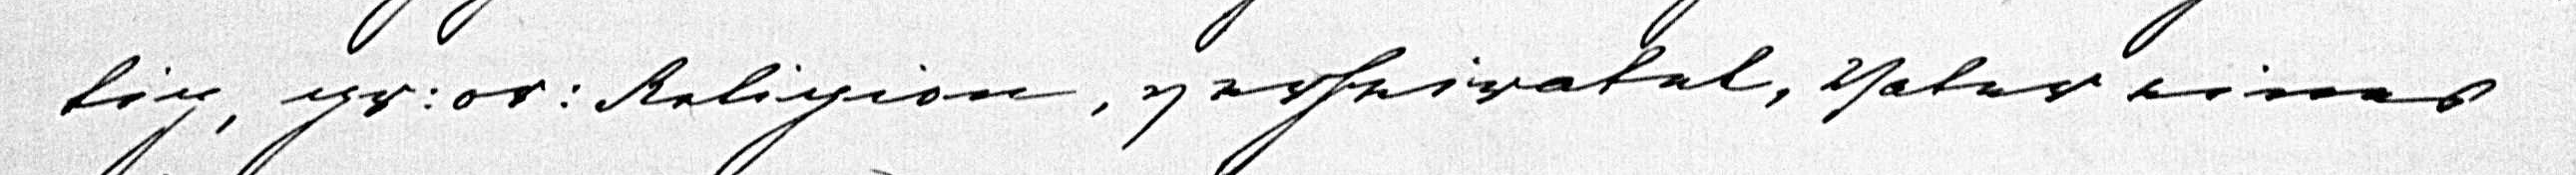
tig, gr. or. Religion, verheiratet, Vater eines
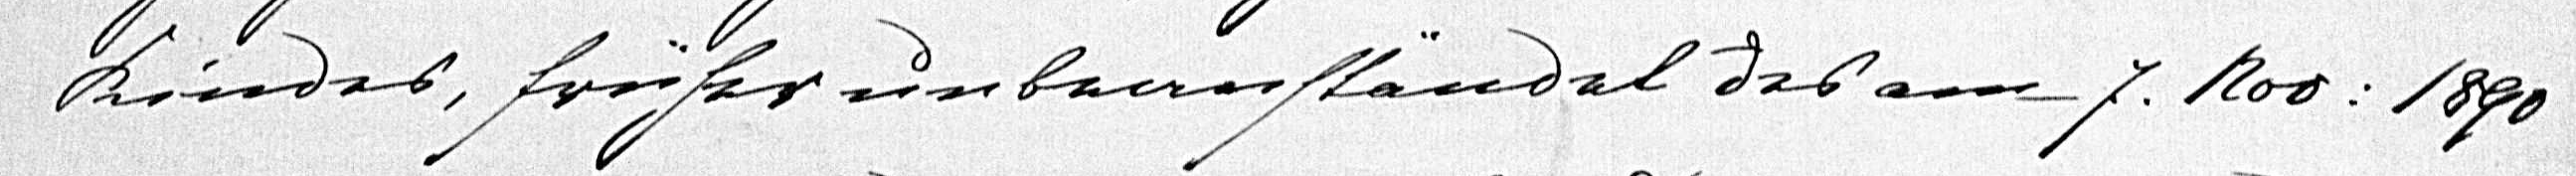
Kindes, früher unbeanständet des am 7. Nov. 1890
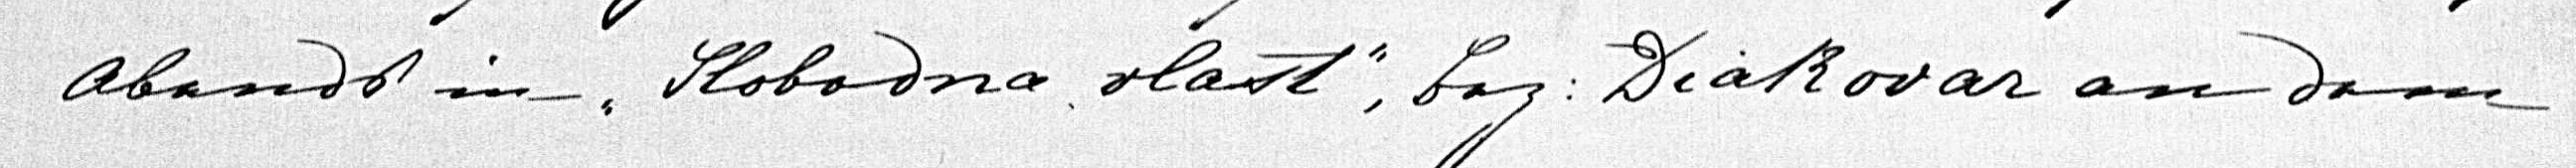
Abends in „Slobodna vlast“ Bez. Diakovar an dem
